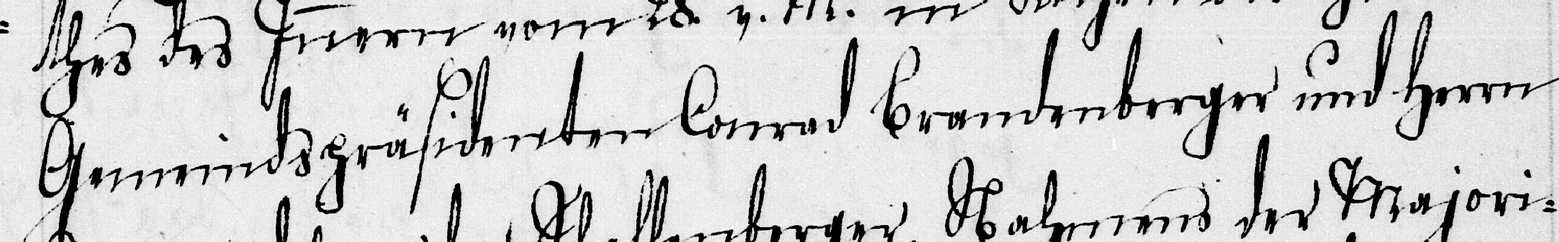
Gemeindepräsidenten Conrad Brandenberger und Herrn
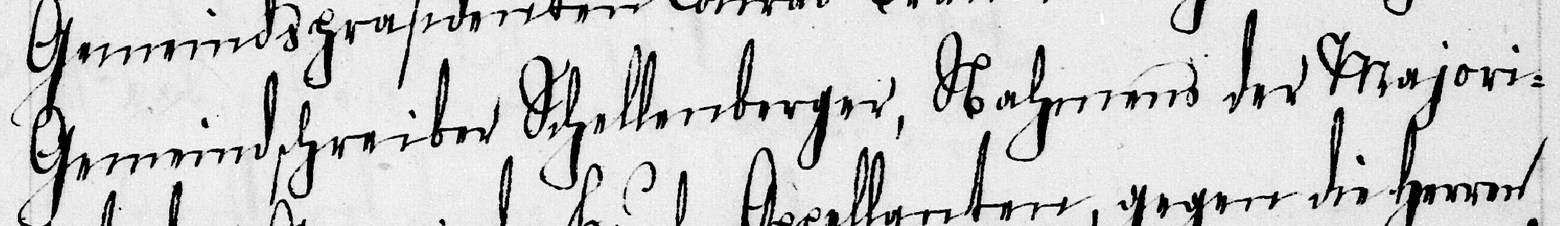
Gemeindeschreiber Schellenberger, Nahmens der Majori¬
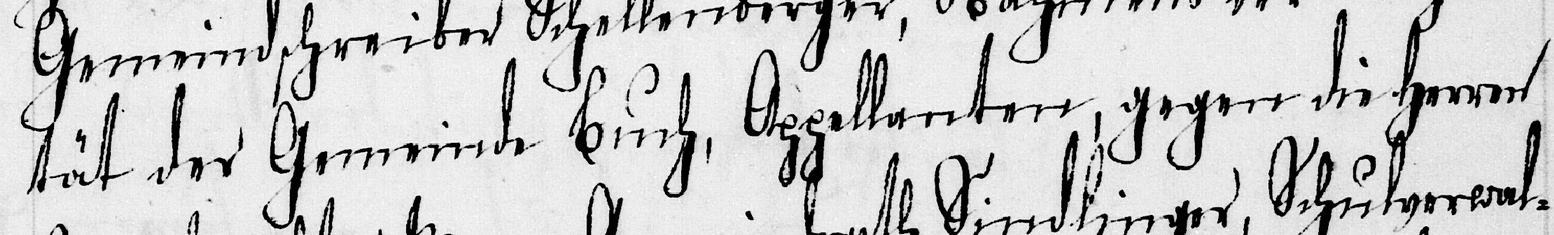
tät der Gemeinde Buch, Appellanten, gegen die Herren
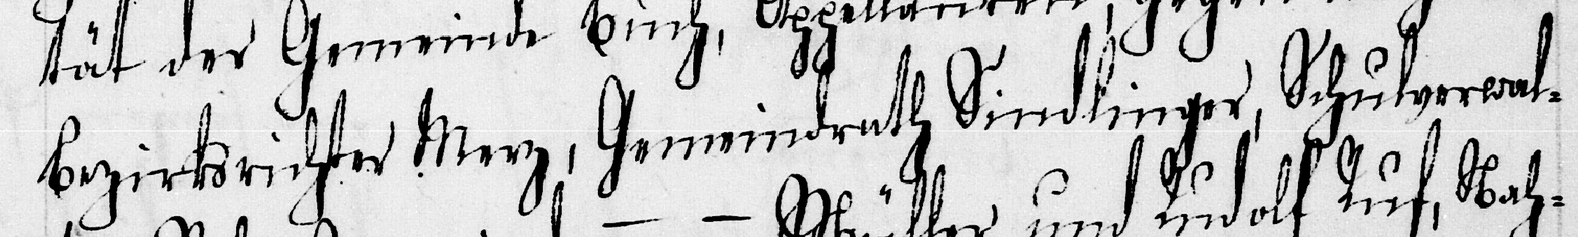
Bezirksrichter Merz, Gemeindrath Sindlinger, Schulverwal¬
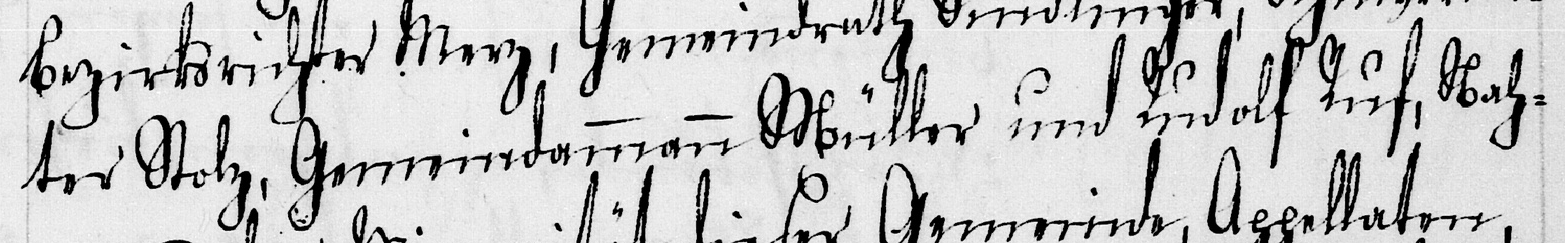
ter Stolz, Gemeindammann Müller und Rudolf Ruf, Nah¬
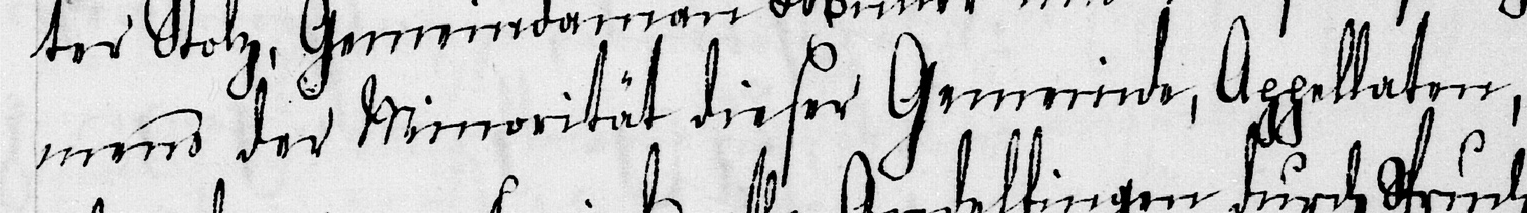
mens der Minorität dieser Gemeinde, Appellaten,
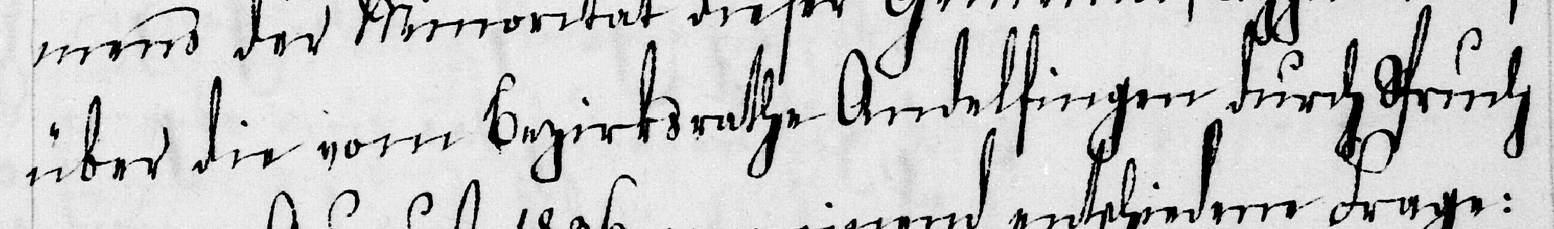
über die vom Bezirksrathe Andelfingen durch Spruch
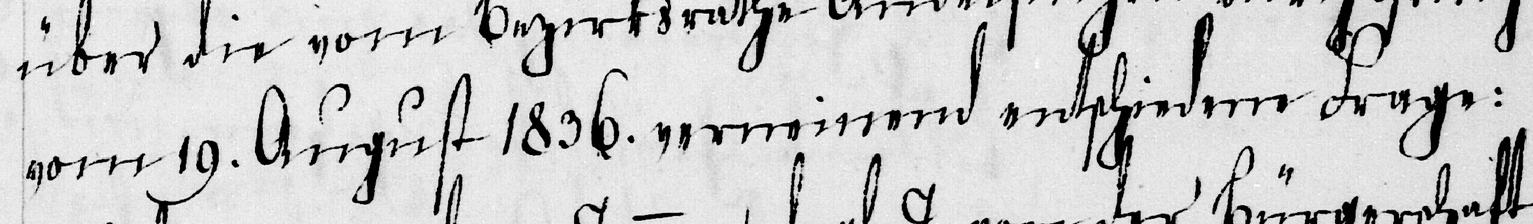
vom 19. August 1836. verneinend entschiedene Frage:
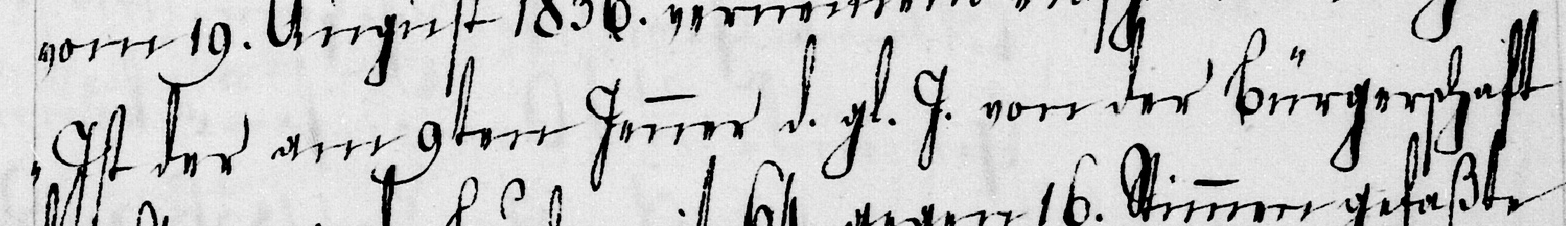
„Ist der am 9ten Jenner d. gl. J. von der Bürgerschaft
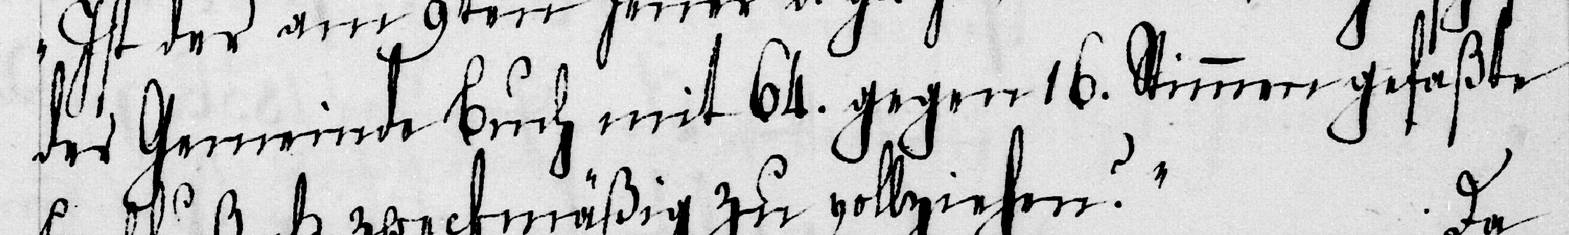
der Gemeinde Buch mit 64. gegen 16. Stimmen gefaßte
